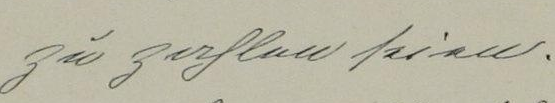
zu zahlen seien.
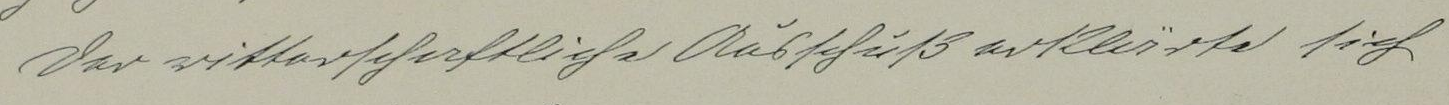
Der ritterschaftliche Ausschuß erklärte sich
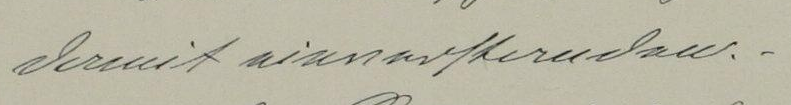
damit einverstanden.
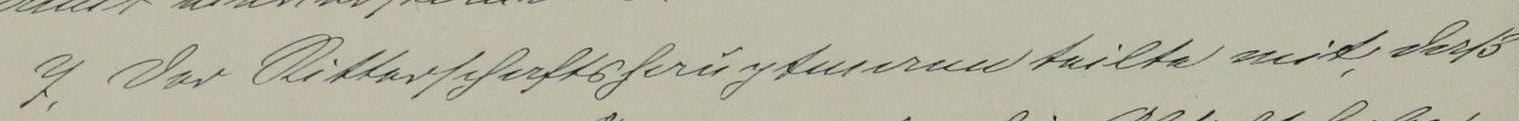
7. Der Ritterschaftshauptmann teilte mit, daß
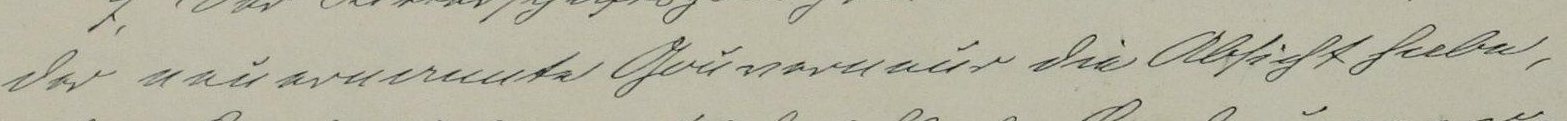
der neuernannte Gouverneur die Absicht habe,
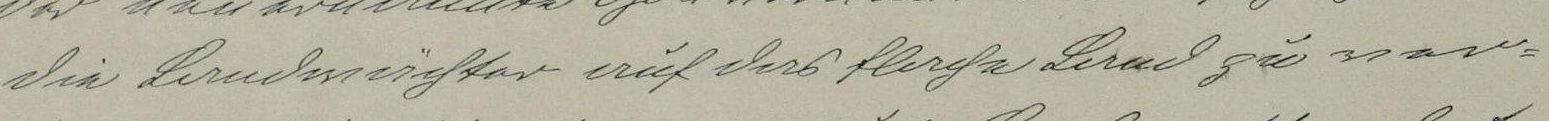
die Landwächter auf das flache Land zu ver-
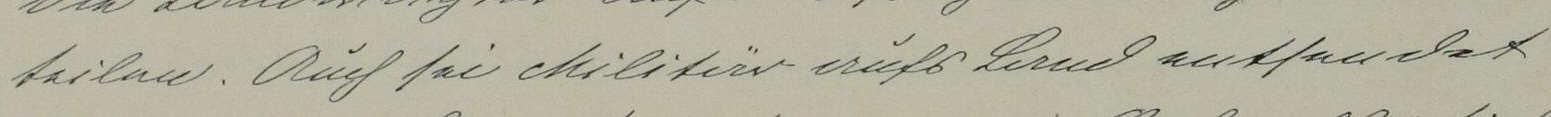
teilen. Auch sei Militär aufs Land entsendet
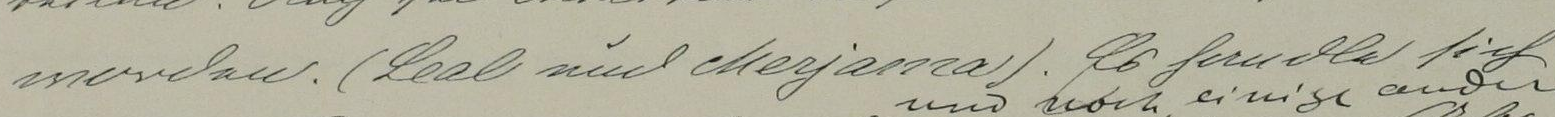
worden. (Leal und Merjama). Es handle sich
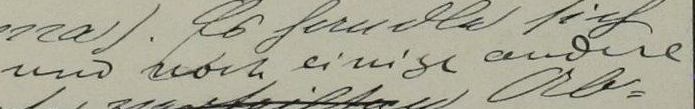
und noch einige andere
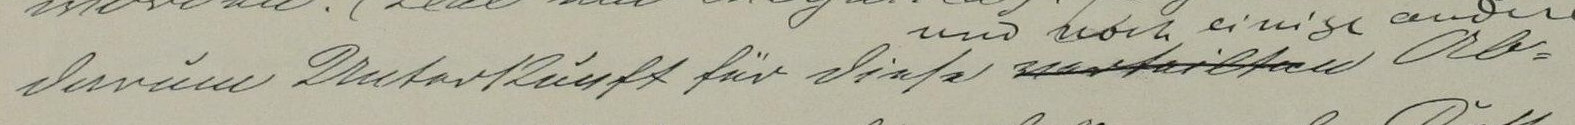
darum, Unterkunft für diese verteilten Ab-
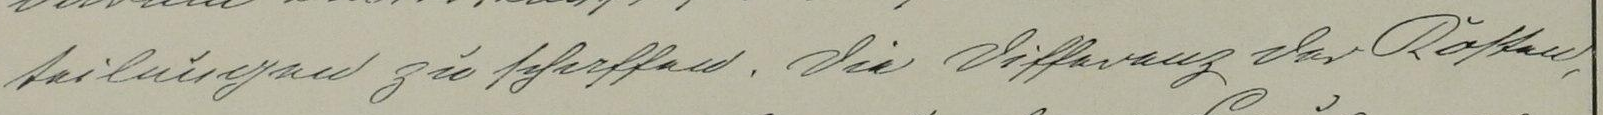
teilungen zu schaffen. Die Differenz der Kosten,
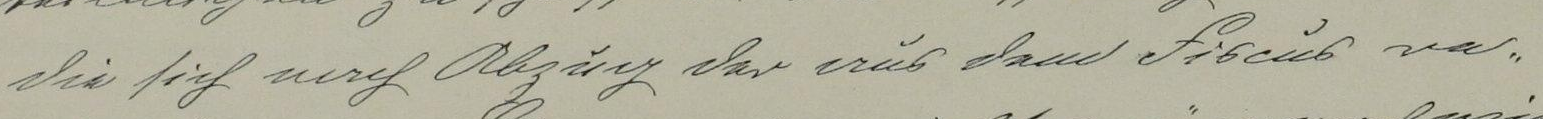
die sich nach Abzug der aus dem Fiscus re-
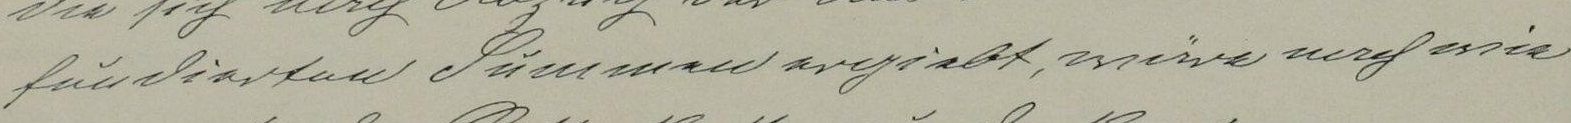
fundierten Summen ergiebt, wäre nach wie
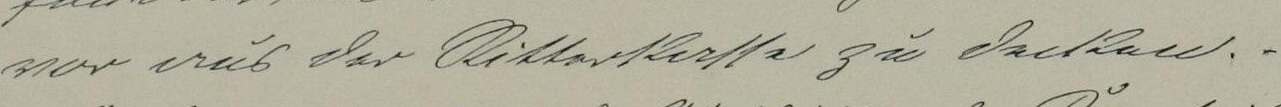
vor aus der Ritterkasse zu decken.
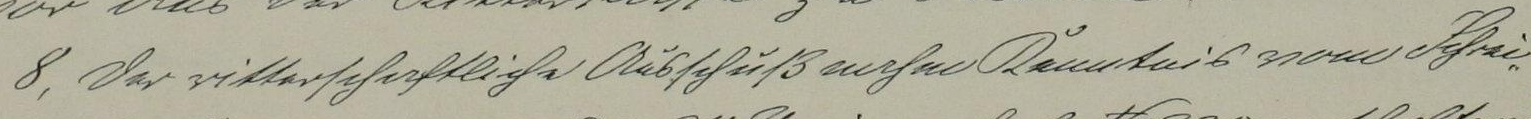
8. Der ritterschaftliche Ausschuß nahm Kenntnis vom Schrei-
